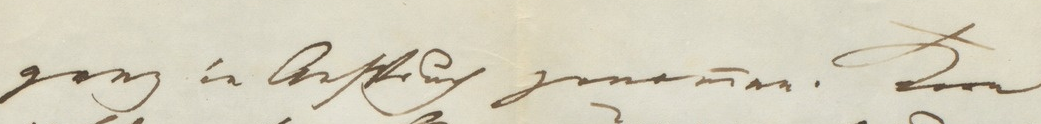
ganz in Anspruch genommen. Kern &
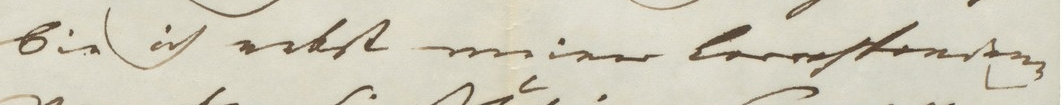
bin ich nebst meiner Correspondenz
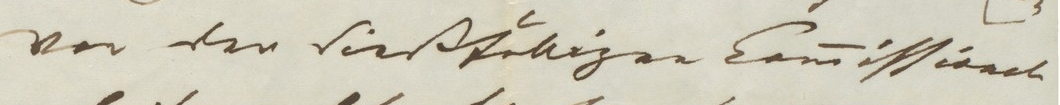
von den dießfälligen Commissional-
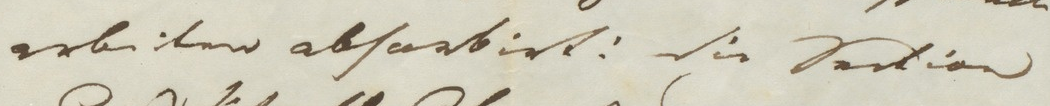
arbeiten absorbirt: Die Section
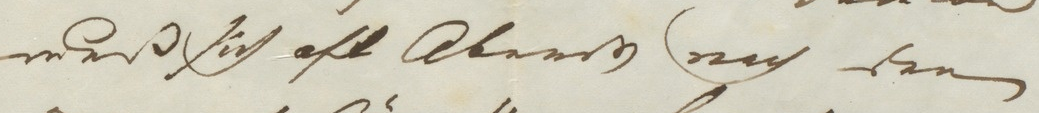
muß sich oft Abends nach den
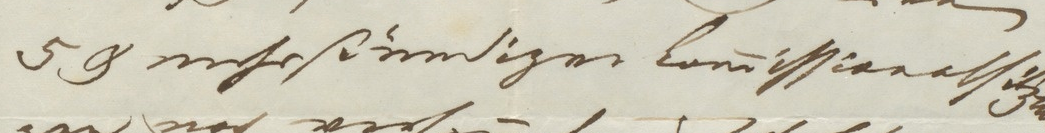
5 & mehrstündigen Commissionalsitzun-
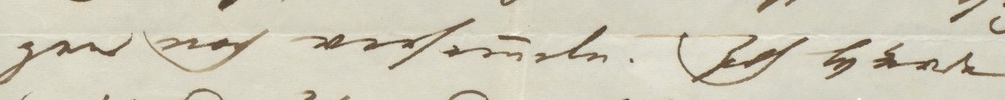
gen noch versammeln. Ich würde
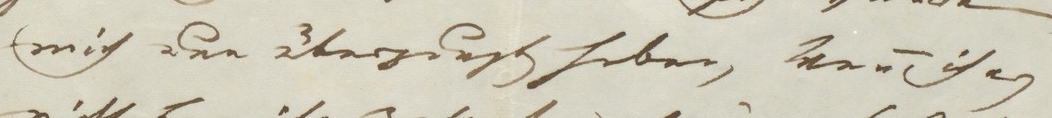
mich nun überzeugt haben, wenn ich es
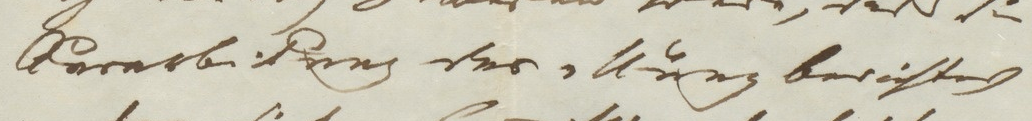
Ausarbeitung des Münzberichtes
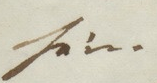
sein.
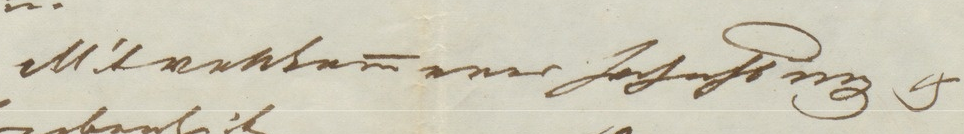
Mit vollkommener Hochachtung &
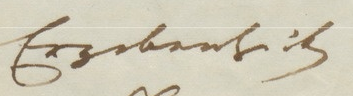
Ergebenheit.
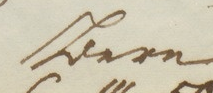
Bern
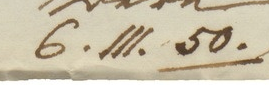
6. III. 1850.
